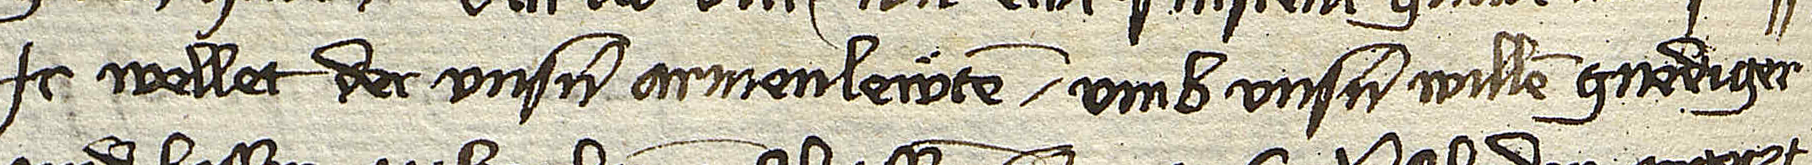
Ir wellet der vnſn* armenleẅte* / vmb vnſn* wille* gnediger
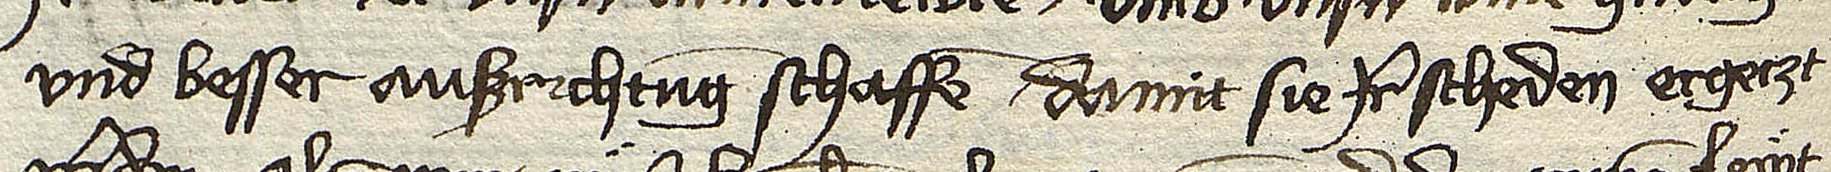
vnd beſſer auſʒrichtug* ſchaffe* / damit ſie Ir* ſcheden ergecʒt
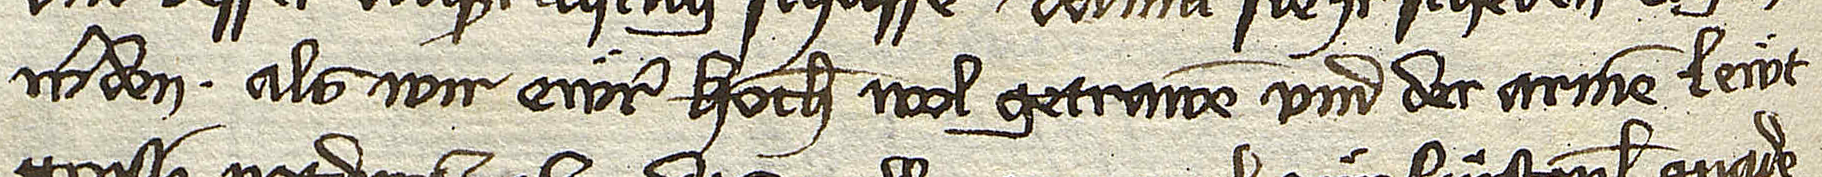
w*den . als wir eẅr* hoch* wol getrawe* vnd der arme leẅt
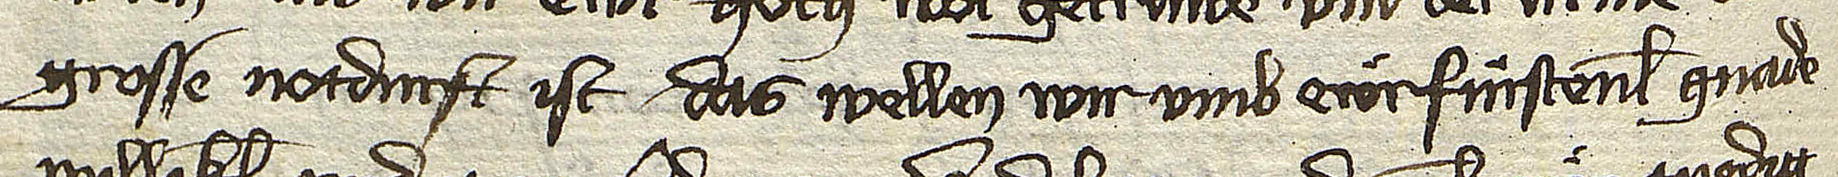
groſſe notdurft iſt / das wellen wir vmb eẅr fürſtenl* gnade
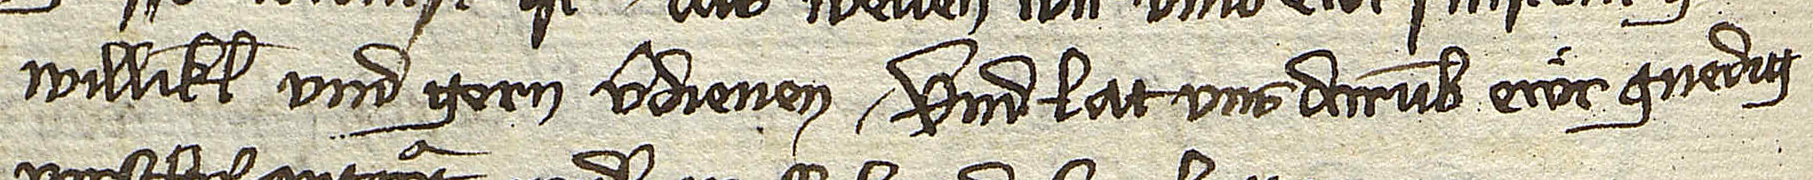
willikl* vnd gern v*dienen / Vnd lat vns darub* eẅr gnedig
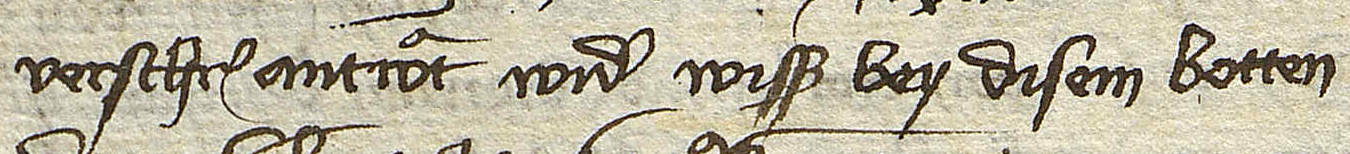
verſchr* antwt* wid* wiſſ* bey diſem botten
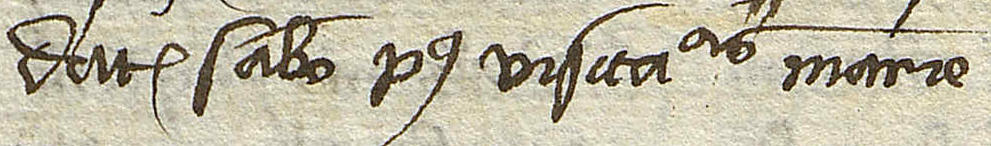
Dat* ſabo* p* viſita* marie .
